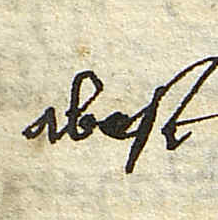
abeſt
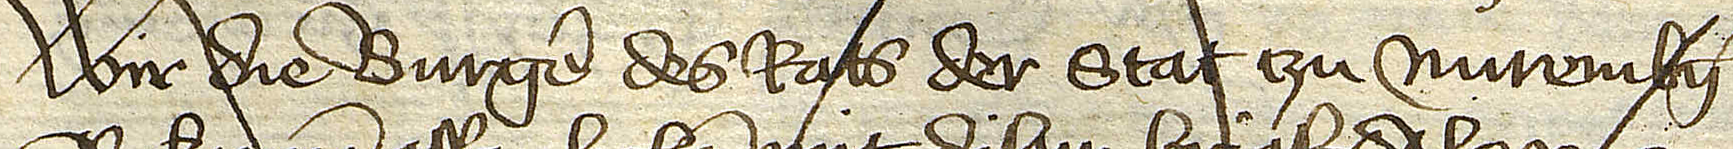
Wir die Burge* des Rats der Stat cʒu Nüremb*g
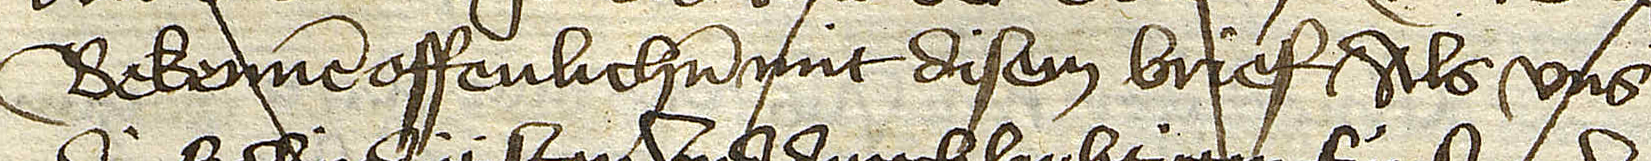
Bekenne* offenlich*n mit diſem brief / Als vns
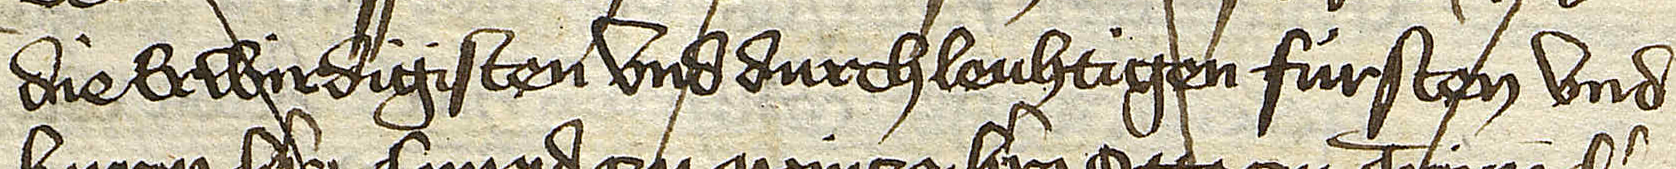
die Erwirdigiſten vnd durchleuhtigen fürſten vnd
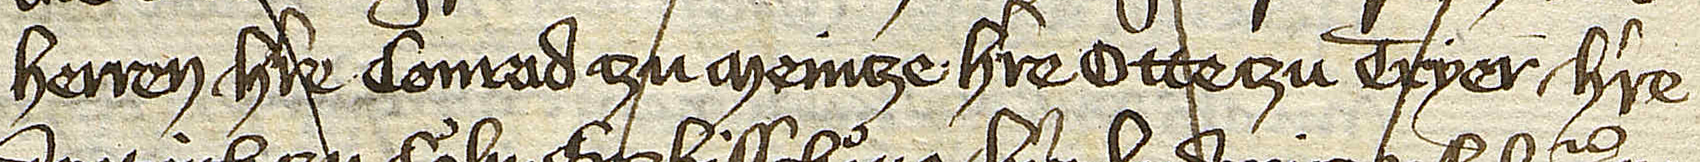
herren / h*re Conrad cʒu Meincʒe h*re Otte cʒu Tryer / h*re
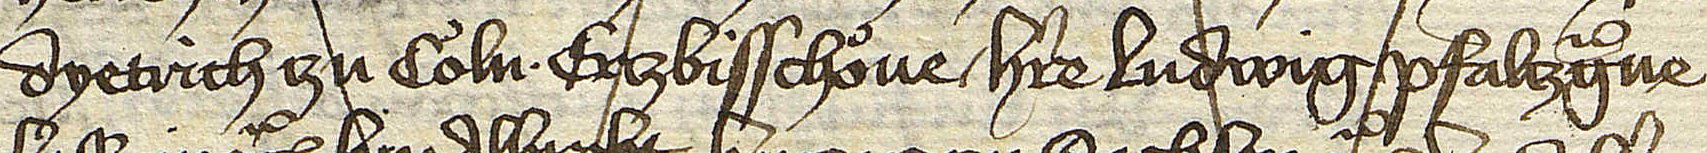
Dyetrich cʒu Cöln . Ercʒbiſſchöue / h*re ludwig pfalcʒg*ue
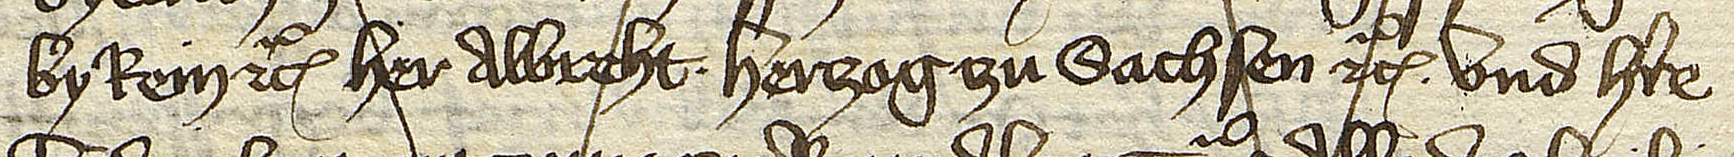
by Rein ec* her Albrecht . hercʒog cʒu Sachſen ec* . vnd h*re
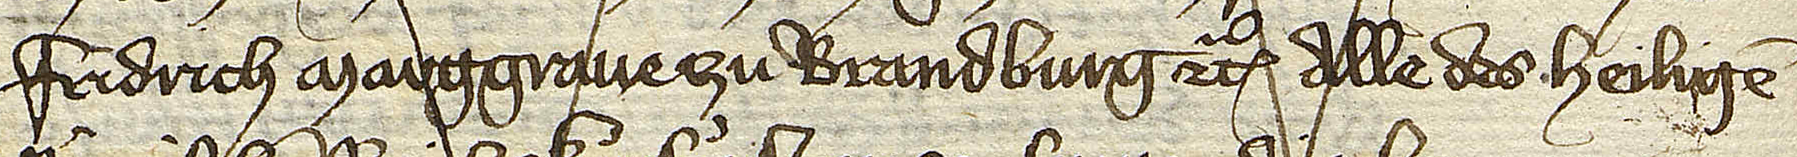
Fridrich Marggraue cʒu Brand*burg ec* Alle des heilige*
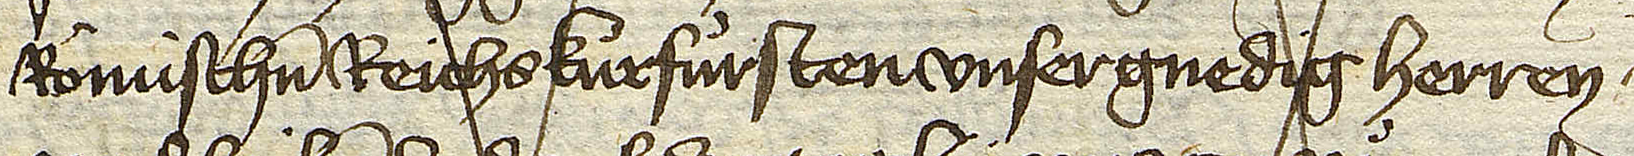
Römiſch*n Reichs kürfürſten vnſer gnedig herren /
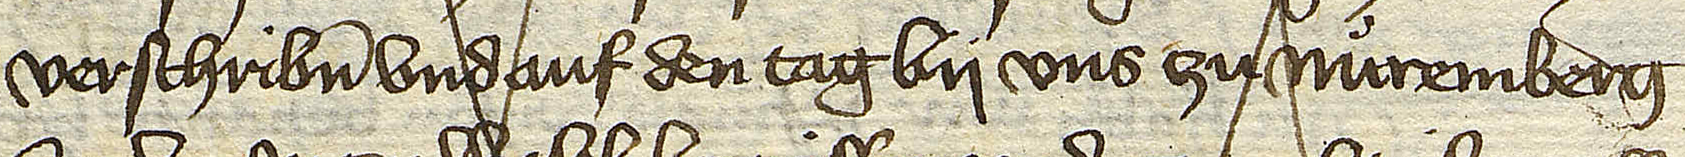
verſchrib*n vnd auf den tag by vns cʒu Nüremberg
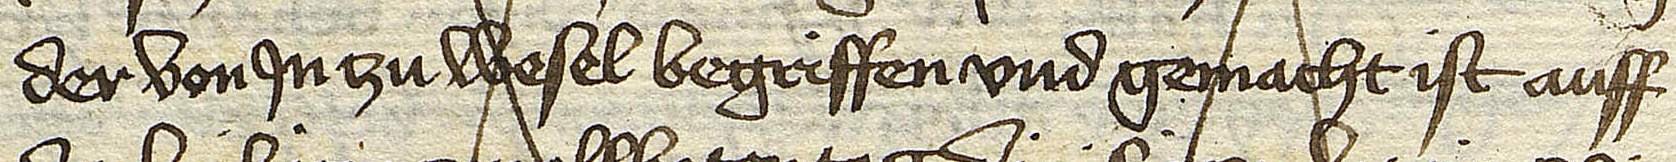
der von In cʒu Weſel begriffen vnd gemacht iſt auff
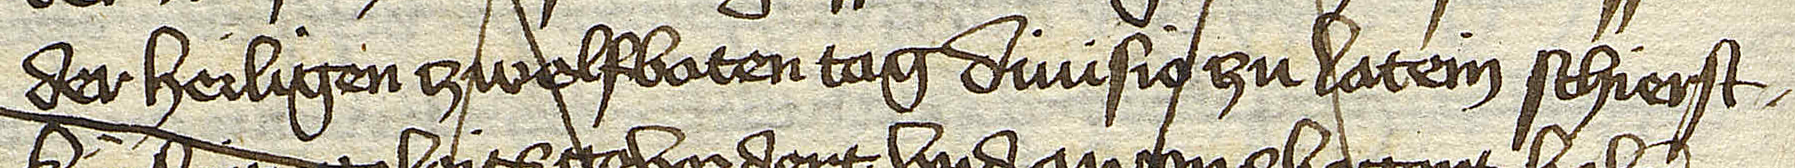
der heiligen cʒwelfboten tag diuiſio cʒu latein ſchieriſt
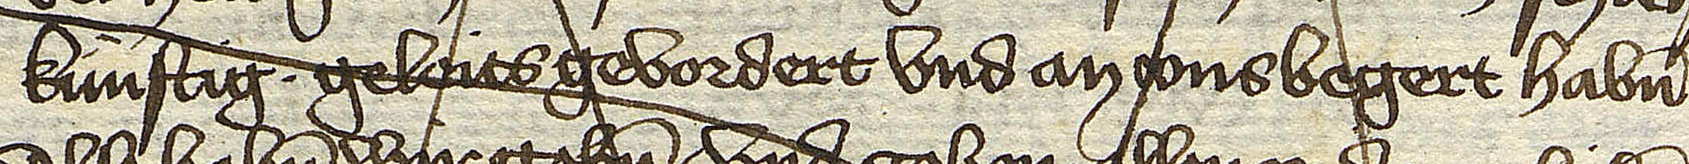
künftig . geleits gevordert vnd an vns begert hab*n
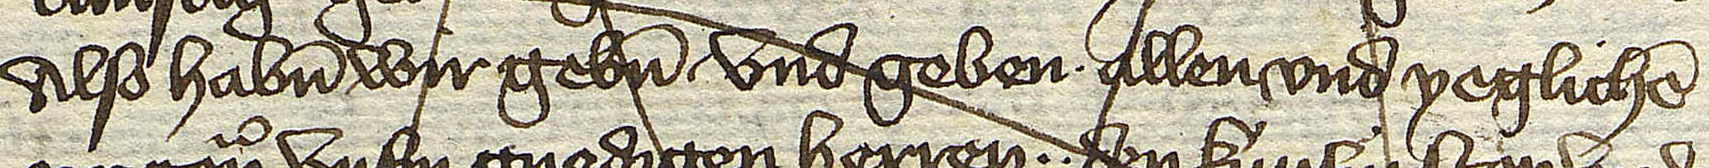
Alſo hab*n wir geb*n / vnd geben . allen vnd yegliche*
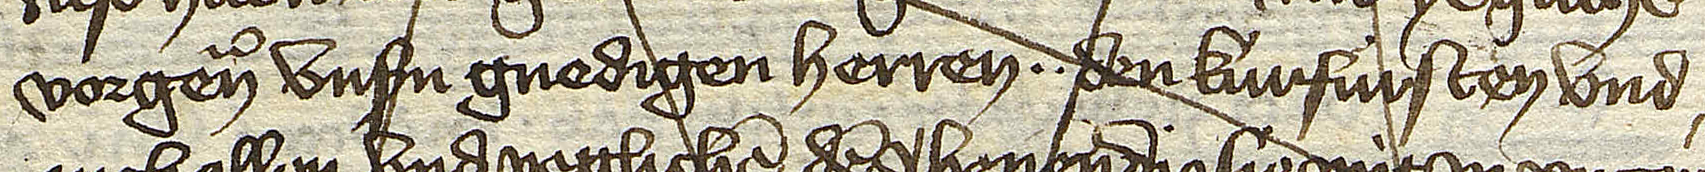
vorgen* vnſ*n gnedigen herren ~ den kürfürſten vnd
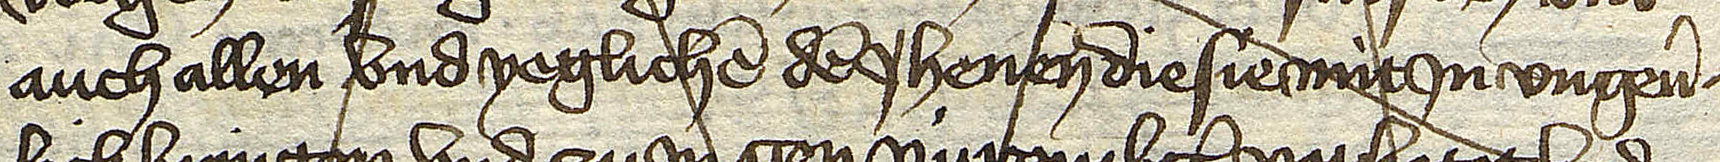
auch allen vnd yegliche* de*Ihenen die ſie mit In vngeu -
